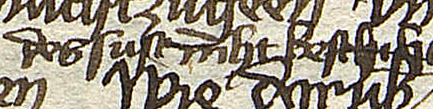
des ſuſt niht beſchiht
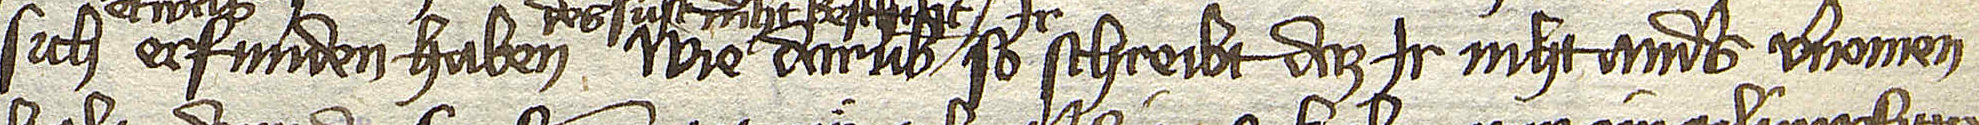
ſich erfunden haben wie darub* ſo ſchreibt daʒ Ir niht ands* v*nomen
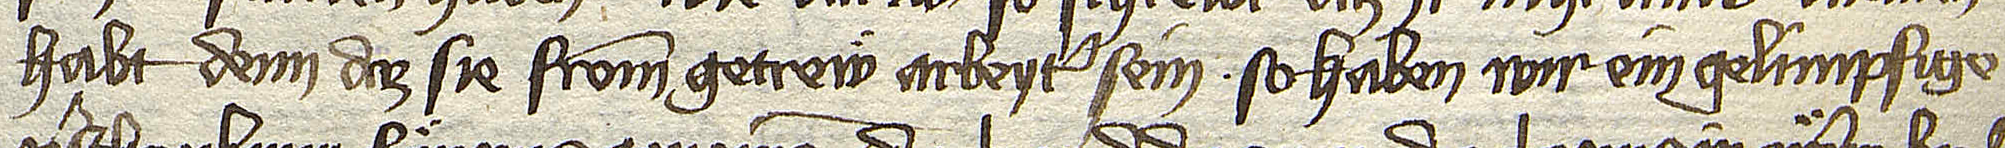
habt denn daʒ ſie from* getreẅ arbeyt* ſein . ſo haben wir ein gelimpfige
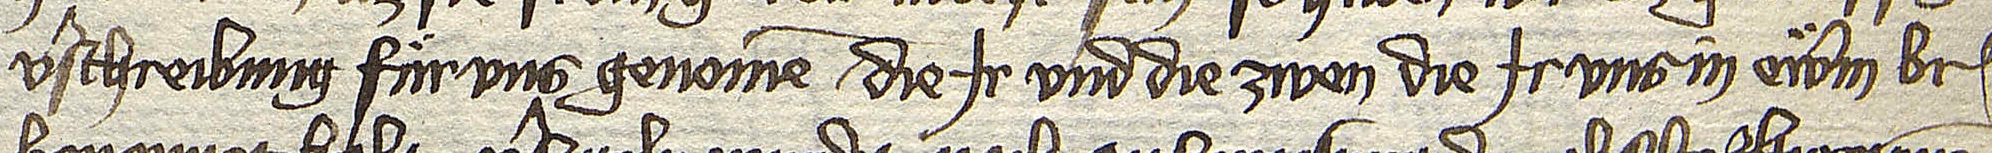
v*ſchreibung für vns genome* / die Ir vnd die ʒwen die Ir vns in eẅ*m br*
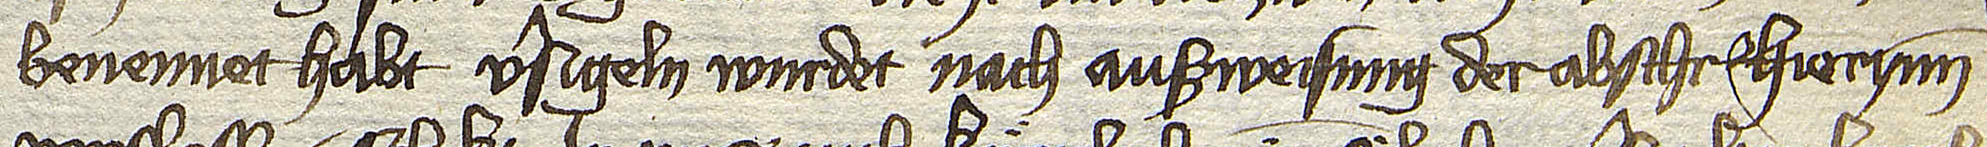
benennet habt v*ſigeln wurdet nach auſʒweiſung der abſchr* hierynn*
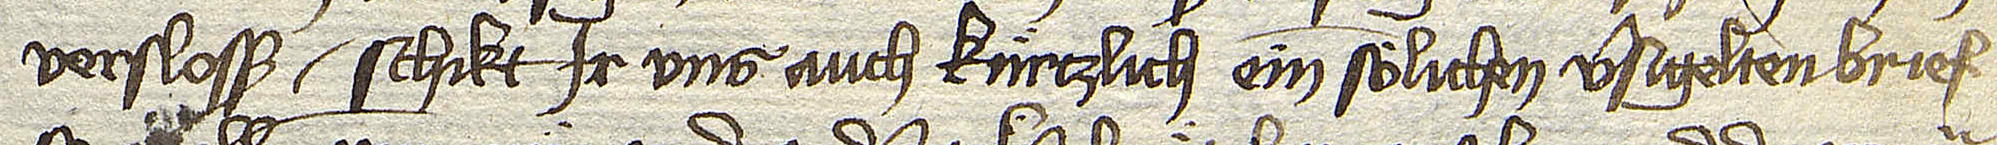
verſloſſ* / ſchikt Ir vns auch kürcʒlich ein* ſölichen v*ſigelten brief
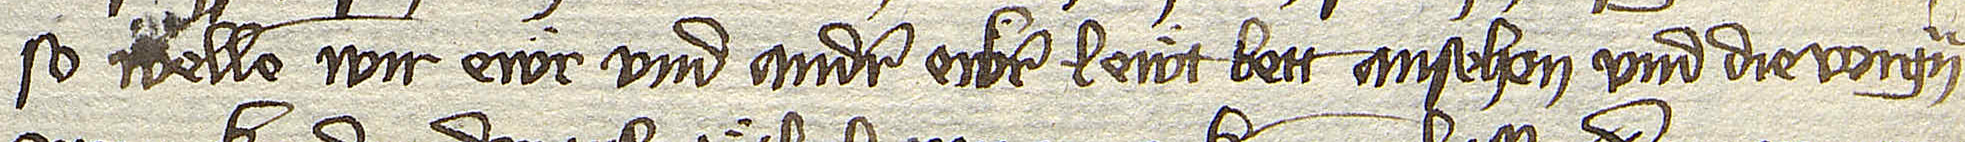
ſo welle* wir eẅr andr* ewr* leẅt bett anſehen vnd die vorgn*
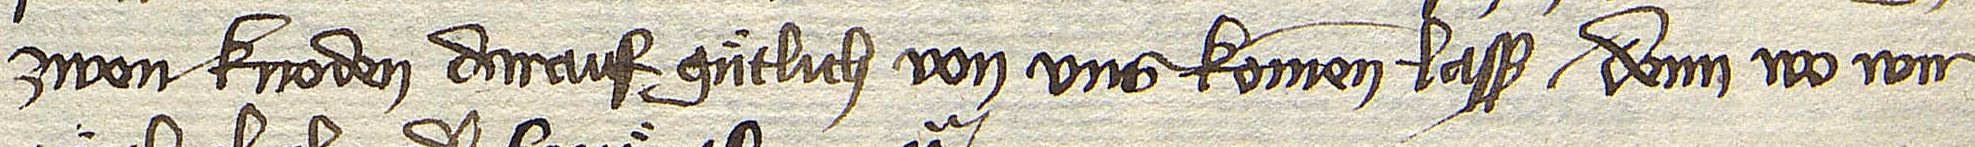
ʒwen Knoden darauf gütlich von vns komen* laſſ* / Denn wo wir
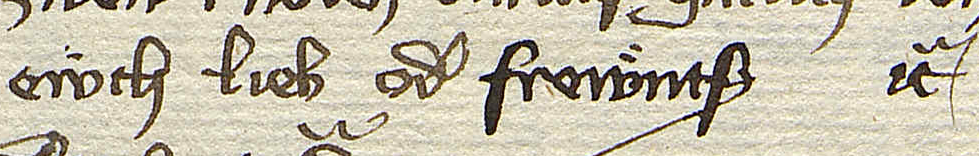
eẅch lieb od* freẅntſ* ec*
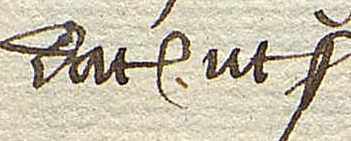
Dat* ut ſ*
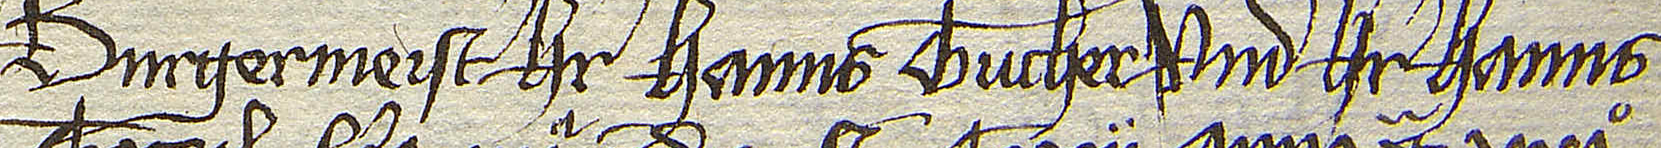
Burgermeiſt* hr* hanns Tucher Vnd hr* hanns
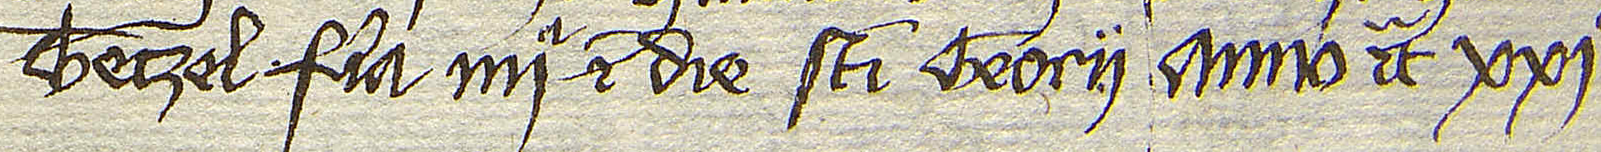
Tecʒel fia* iiii* i* die ſci* Georii Anno ec* xxi*
